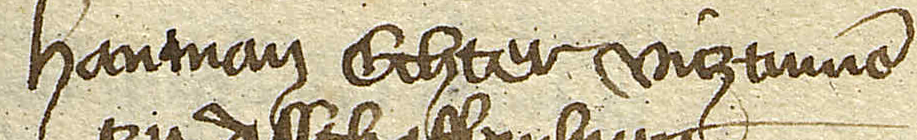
Hanman Echter vicʒtume*
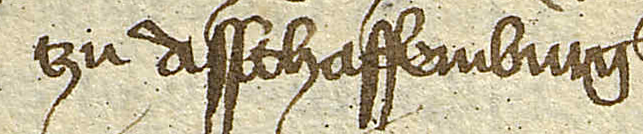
cʒu Aſſchaffemburg
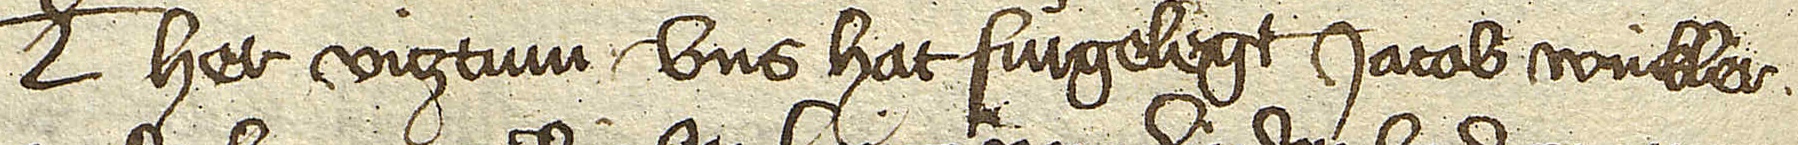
L* her vicʒtum / vns hat fürgelegt Iacob winkler
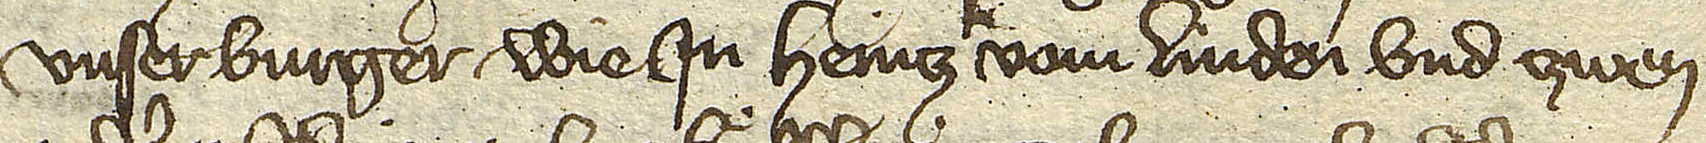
vnſer burger / wie In heincʒ vom Linden vnd cʒwen
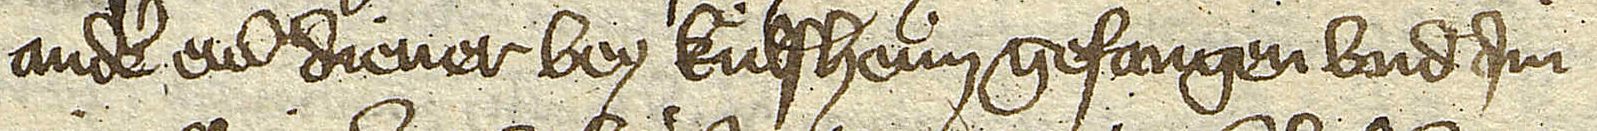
ande* ew* diener bey külſheim gefangen vnd Im
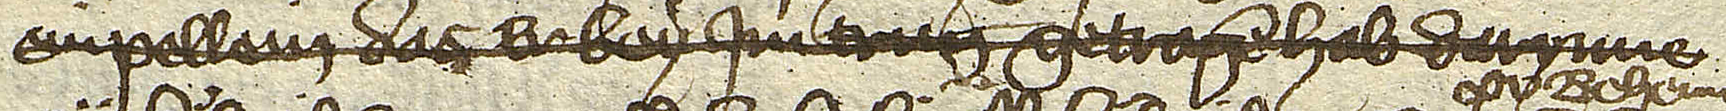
ein pellein das Er bey Im trug getrage* hab darynne
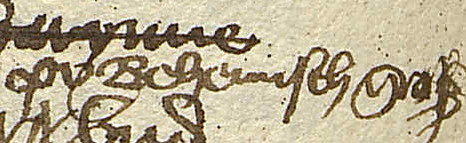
xv Beheimſch groſʒ
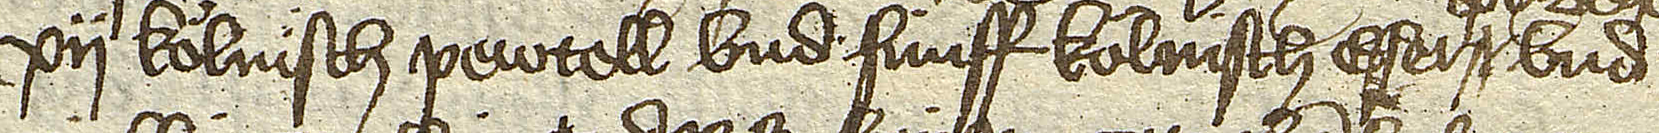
xii kölniſch pewtell vnd fünff kölniſch Eſer / vnd
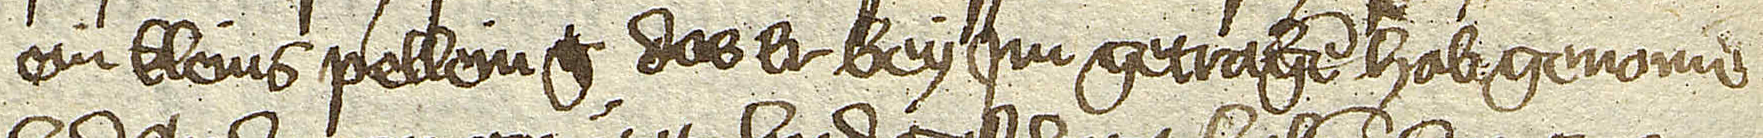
ein kleins pellein g das Er bey Im getrage* hab genome*
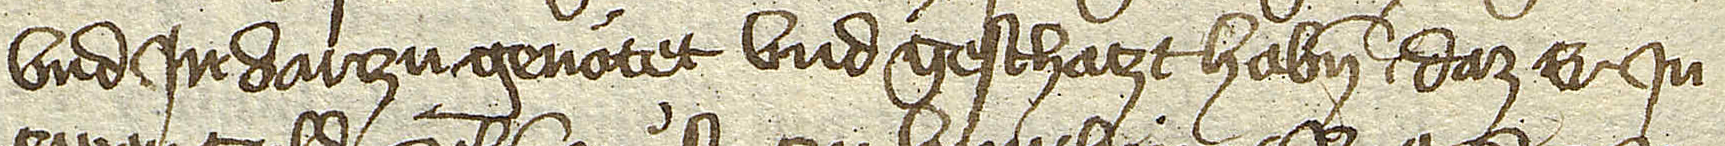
vnd In darcʒu genötet vnd geſchacʒt habn* / daʒ Er In
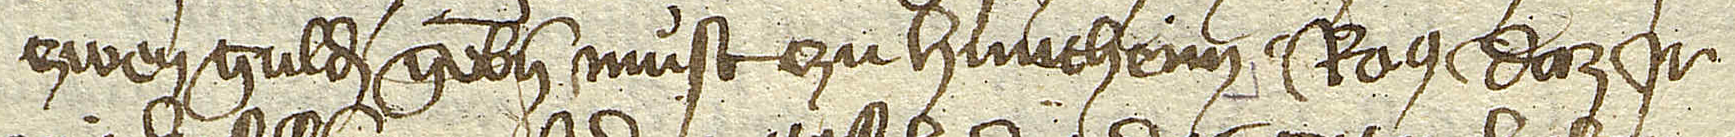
cʒwen guld* gebn* müſt cʒu hintheim / Ro* / daʒ Ir
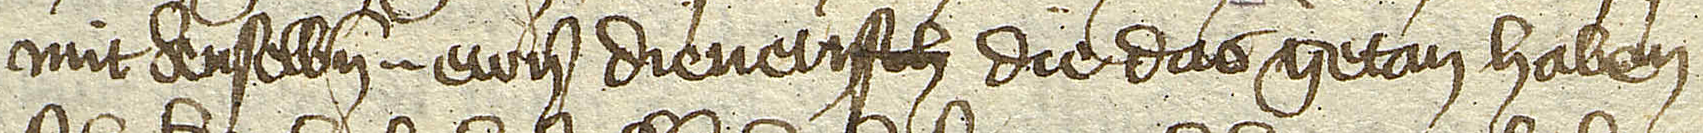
mit denſelbn* ~ ewn* dienerſch die das getan haben
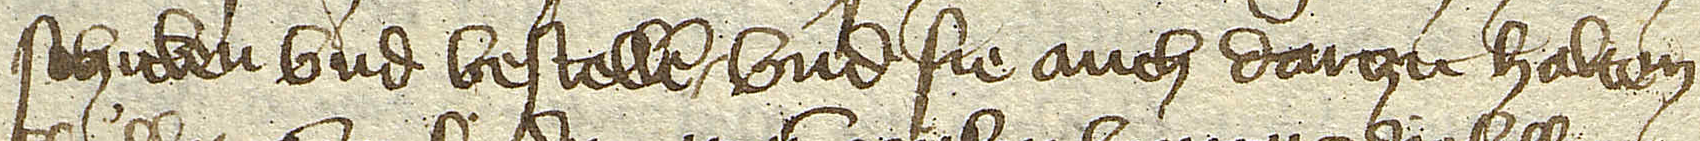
ſchicken vnd beſtelle* / vnd ſie auch darcʒu halten
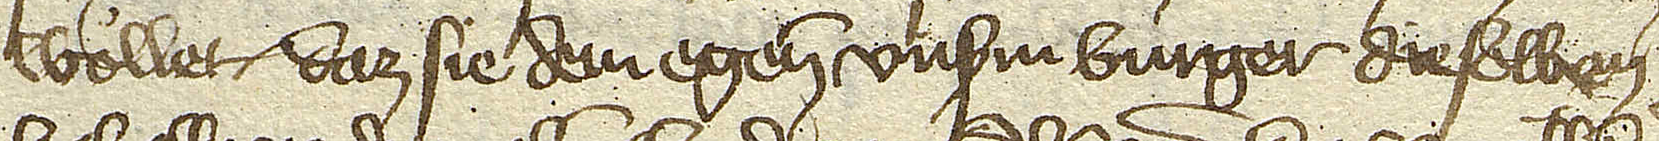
wöllet / daʒ ſie dem egen* vnſ*m burger dieſelben
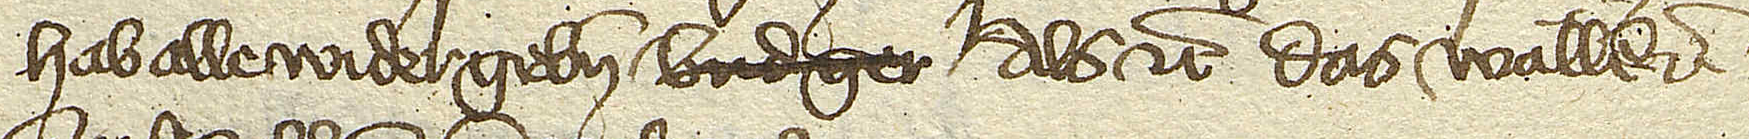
hab alle widergebn* / vnd ger / Als ec* das wölle* ec*
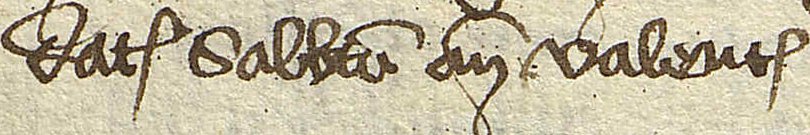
Dat* Sabbto* an* valent*
